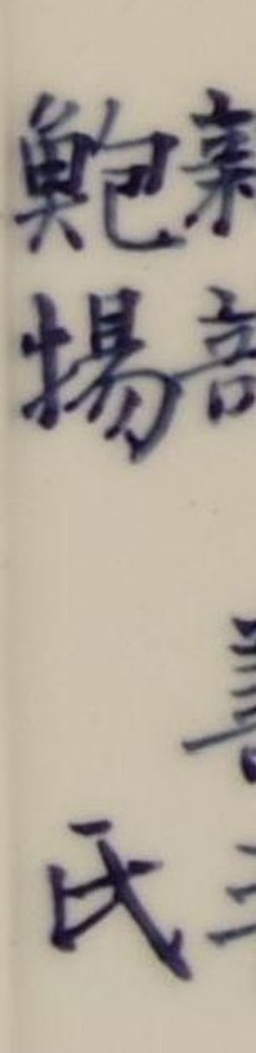鮑揚氏

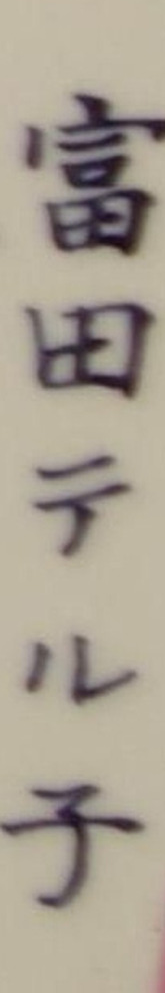富田テル子
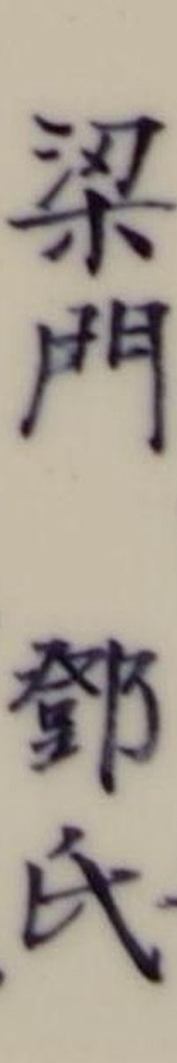梁門鄧氏
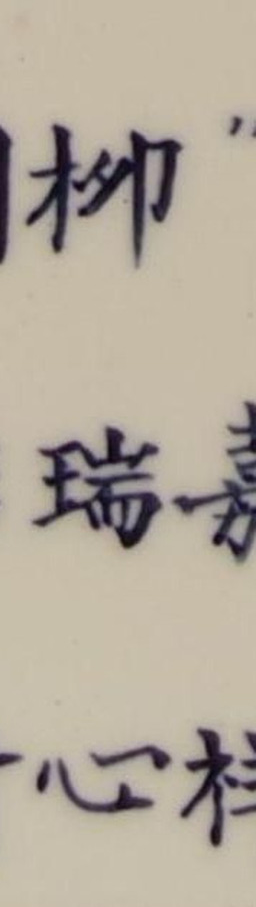柳瑞心
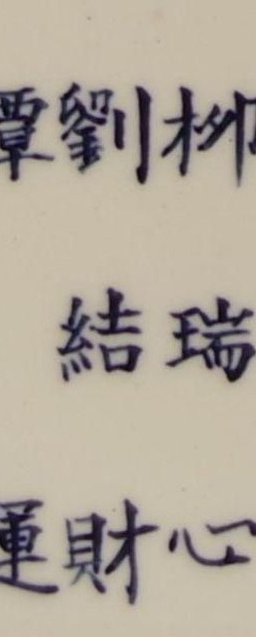劉結財

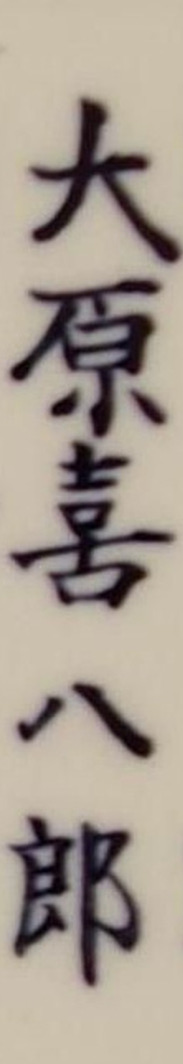大原喜八郎
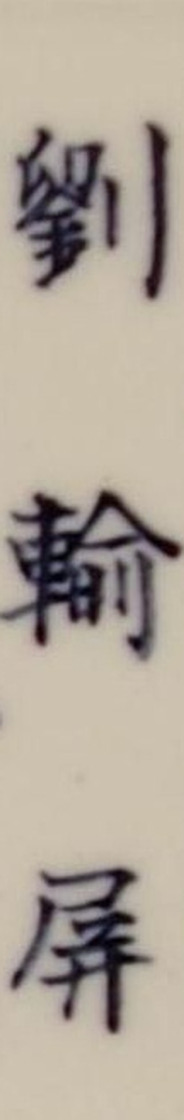劉輪屏
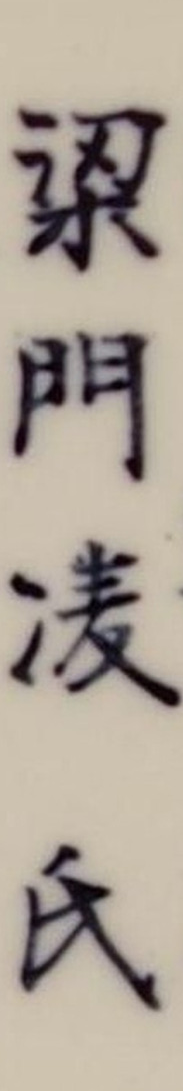梁門凌氏
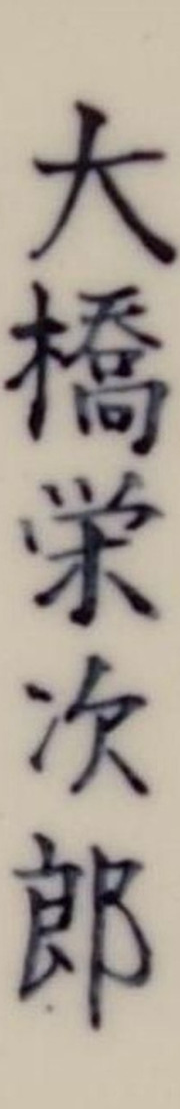大橋栄次郎
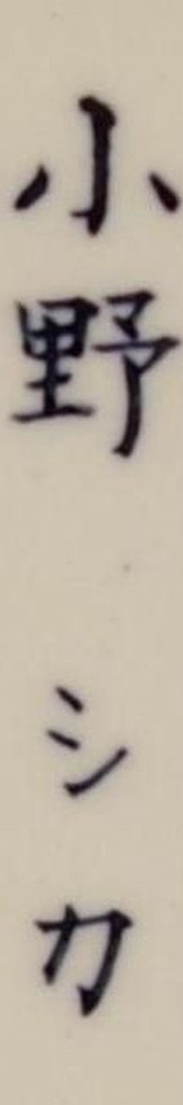小野シカ
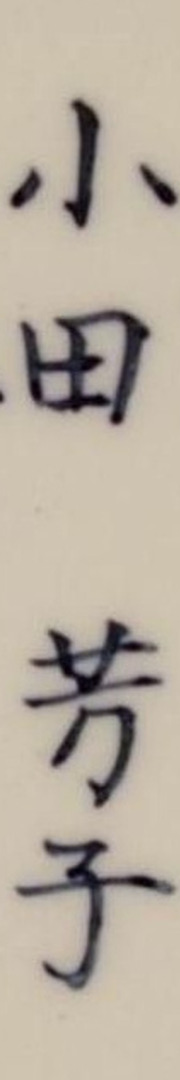小田芳子
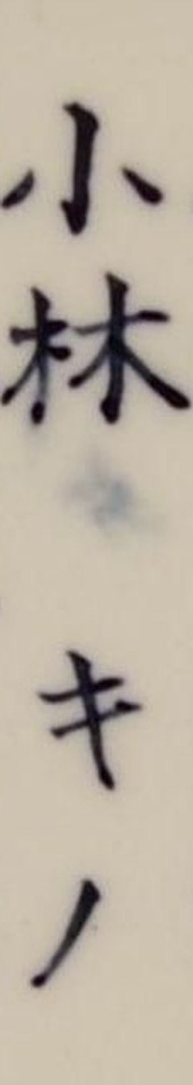小林キノ
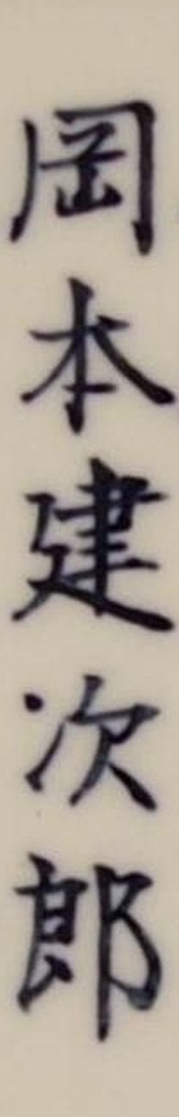岡本建次郎
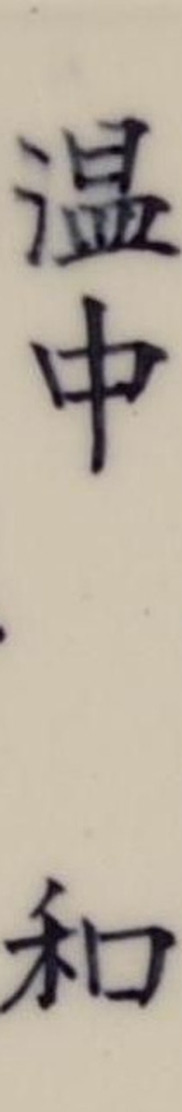温中和
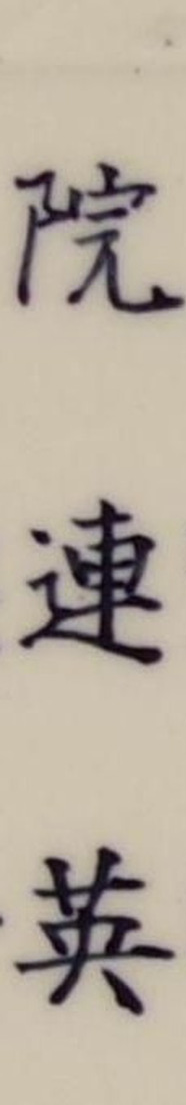院連英

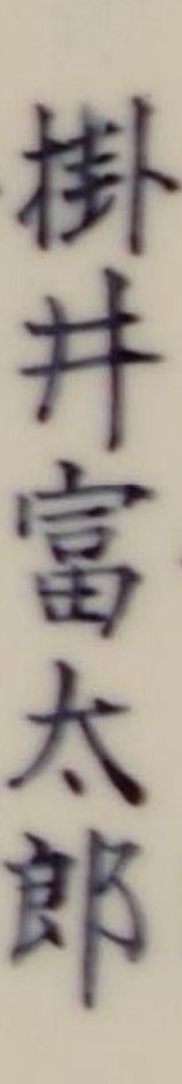掛井富太郎
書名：M~S
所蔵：高野山金剛峯寺
